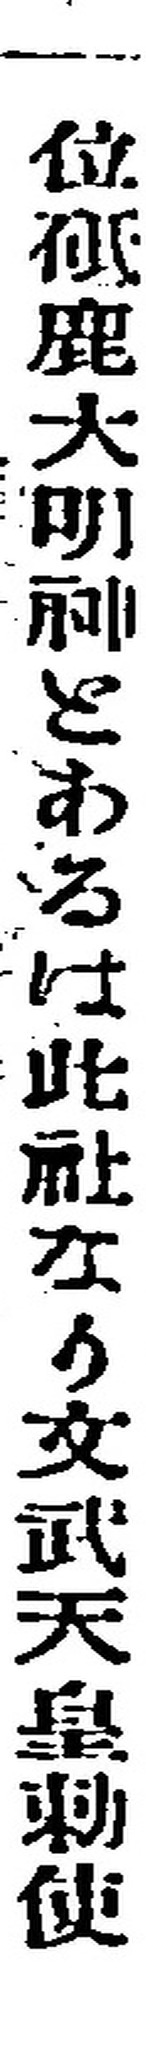位砥鹿大明神とあるは此社なり文武天皇勅使
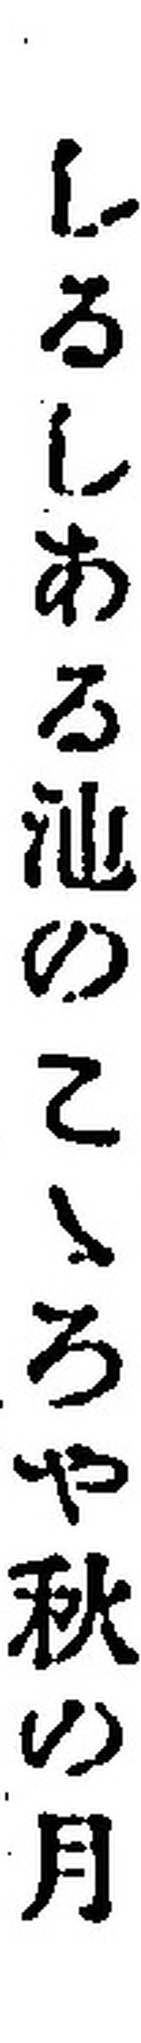しるしある池のこゝろや秋の月
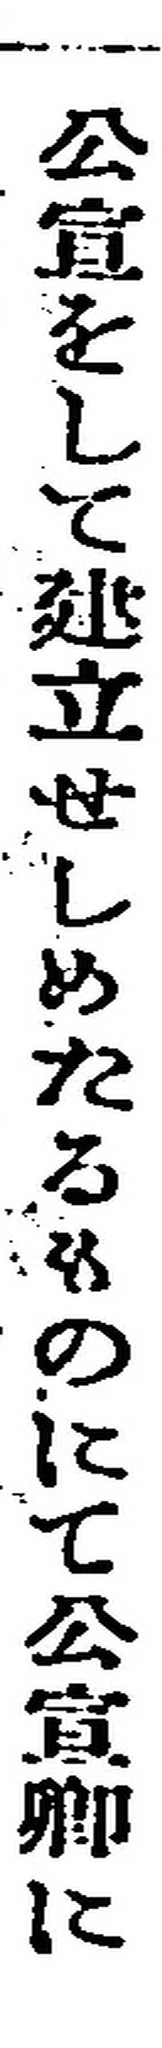公宣をして建立せしめたるものにて公宣卿に
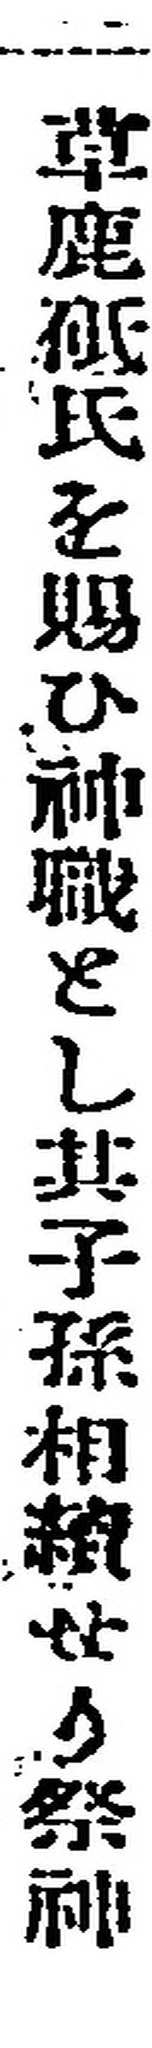草鹿砥氏を賜ひ神職とし其子孫相続せり祭神
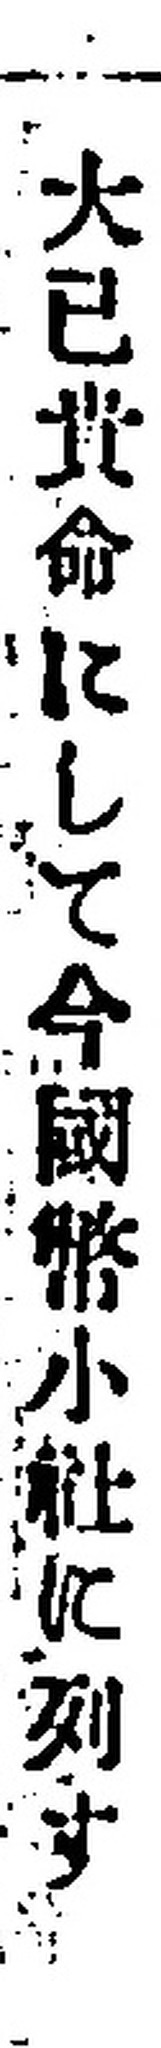大已貴命にして今国幣小社に列す
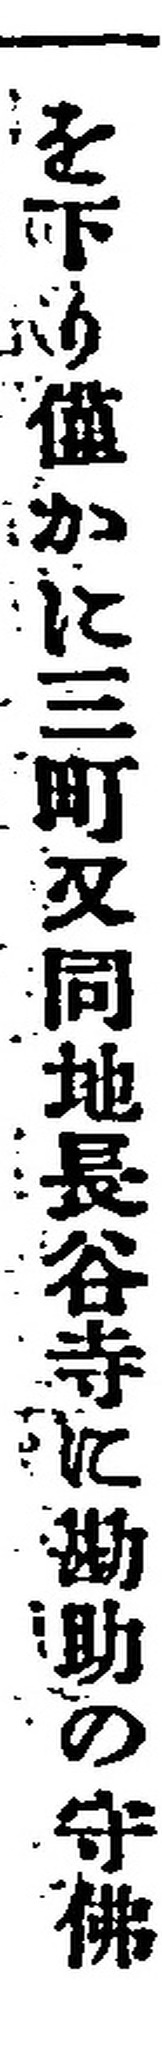を下り僅かに三町又同地長谷寺に勘助の守仏
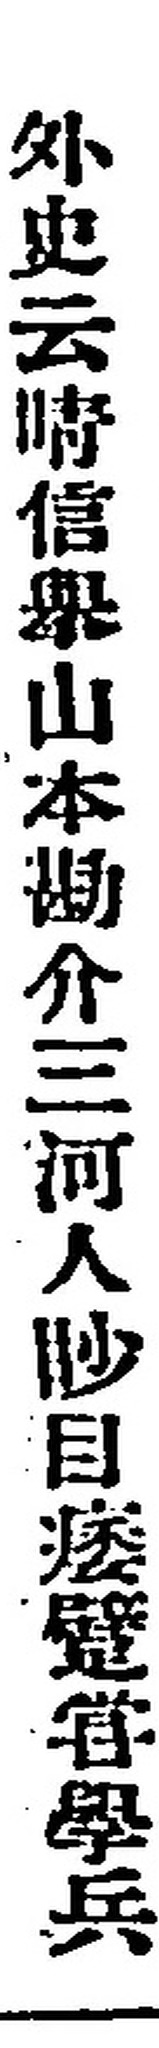外史云晴信挙山本勘介三河人眇目痿躄甞学兵
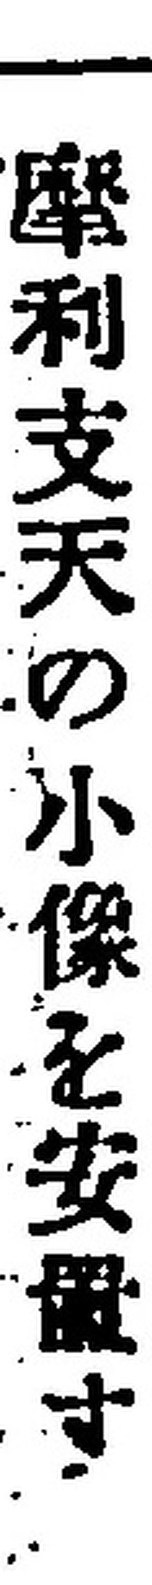摩利支天の小像を安置す
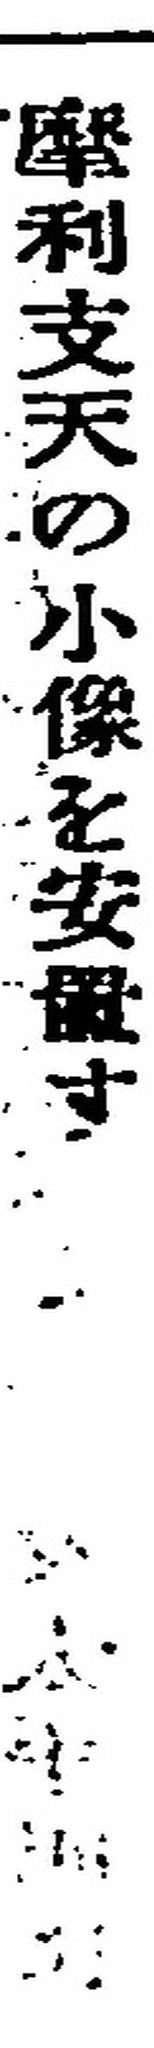摩利支天の小像を安置す
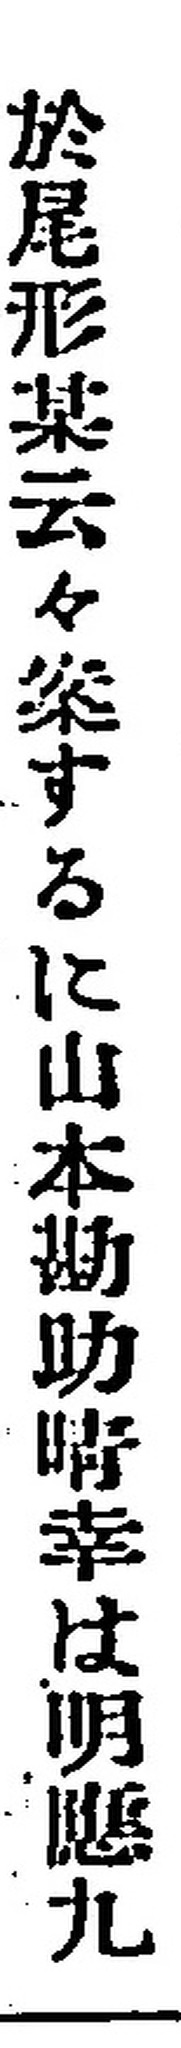於尾形某云々案するに山本勘助晴幸は明応九
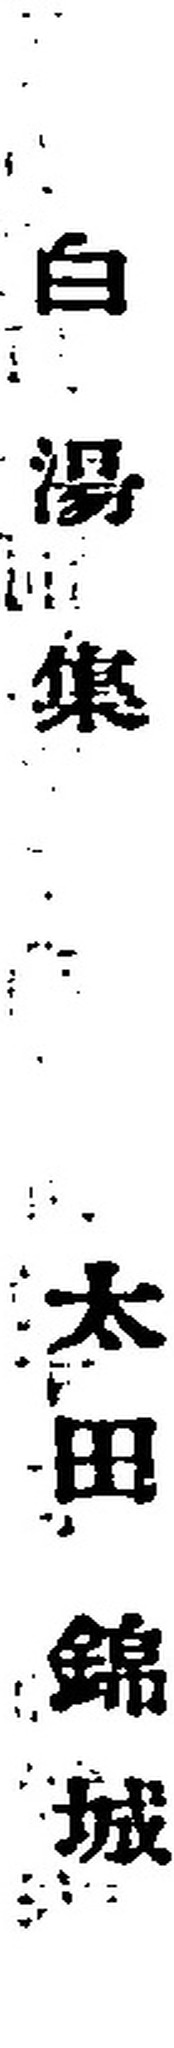白湯集太田錦城
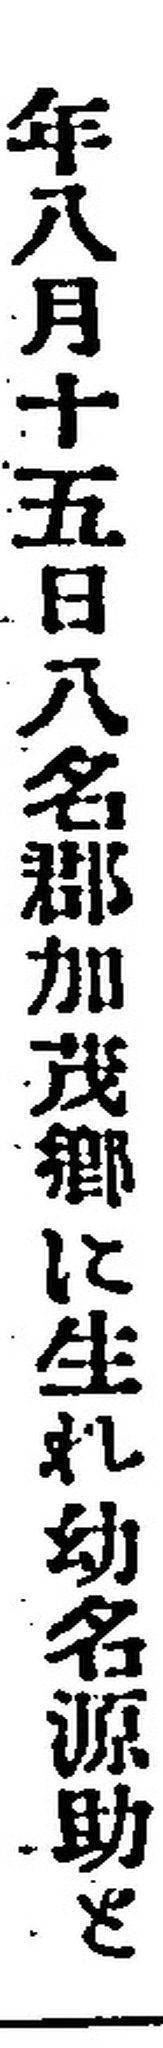年八月十五日八名郡加茂郷に生れ幼名源助と
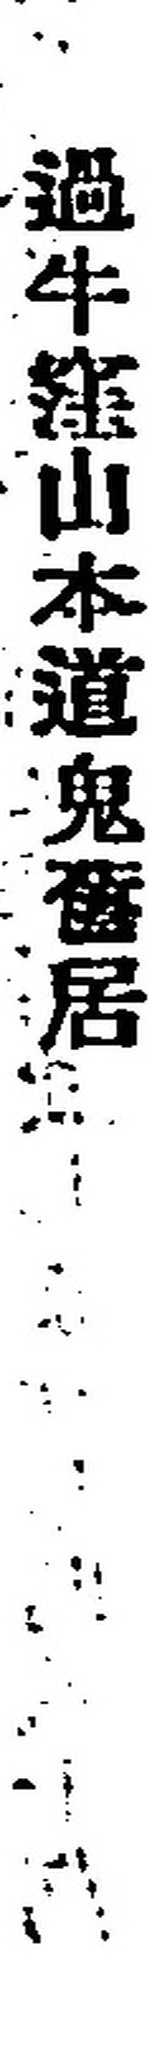過牛窪山本道鬼旧居
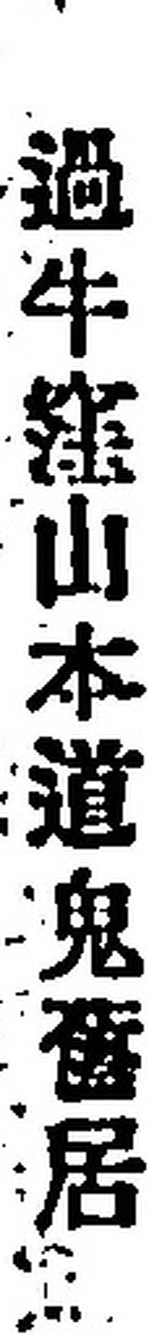過牛窪山本道鬼旧居
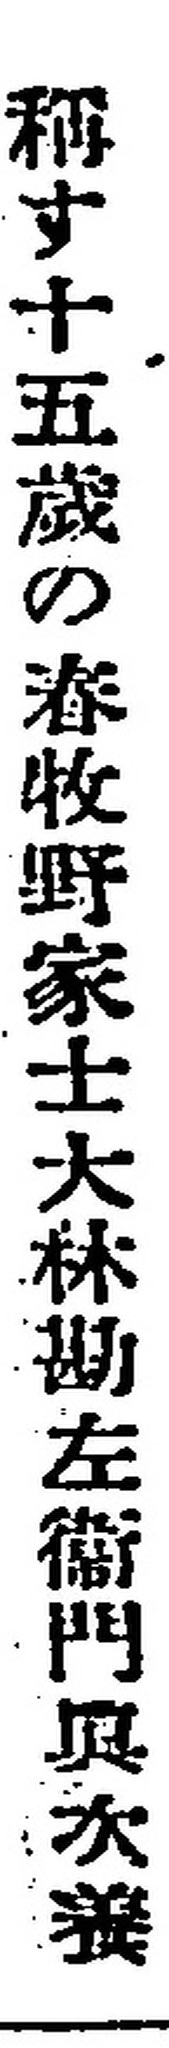称す十五歳の春牧野家士大林勘左衛門真次養
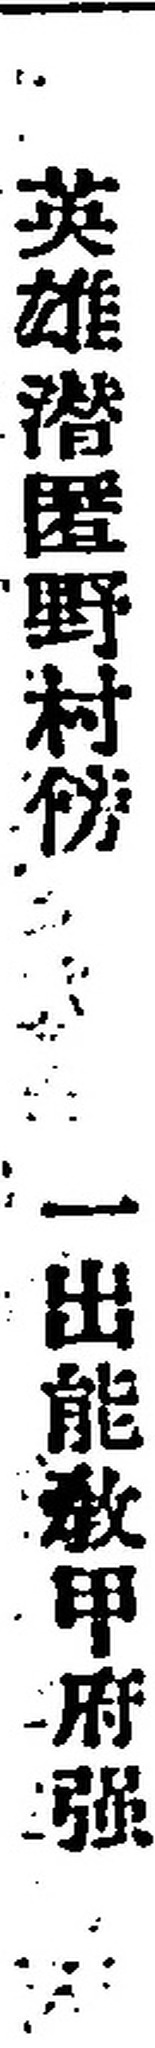英雄潜匿野村傍一出能教甲府強
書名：東参名勝案内
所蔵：国立国会図書館 National Diet Library, JAPAN
